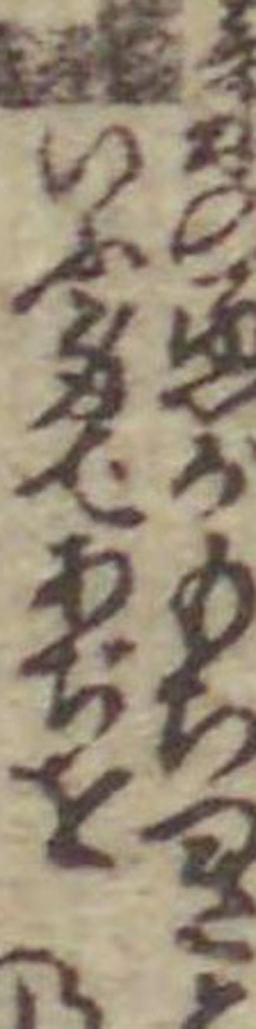いふ身であぢを
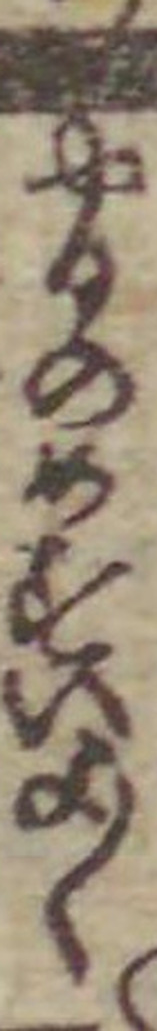ゆるのめすいよ〳〵
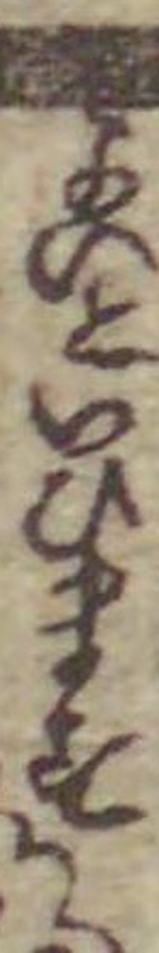よいといひます
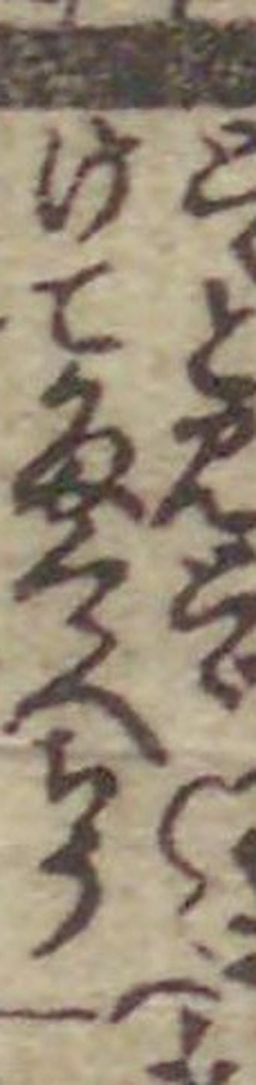けてかまくらへちう
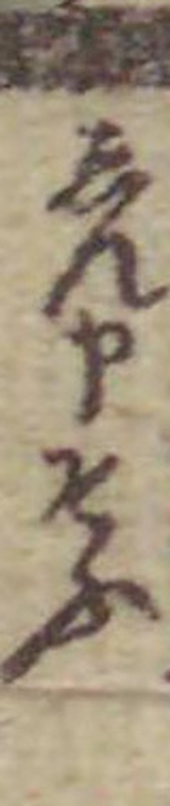しん申そふ

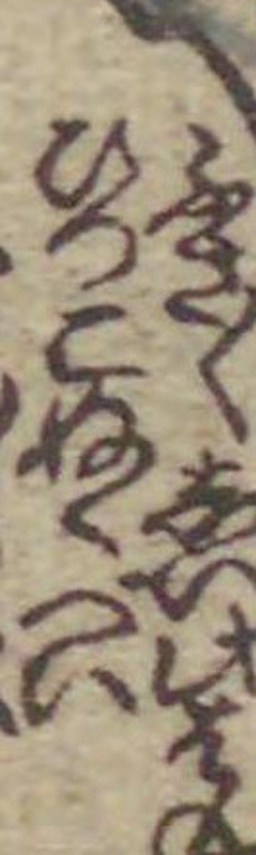ひつこぬくべい
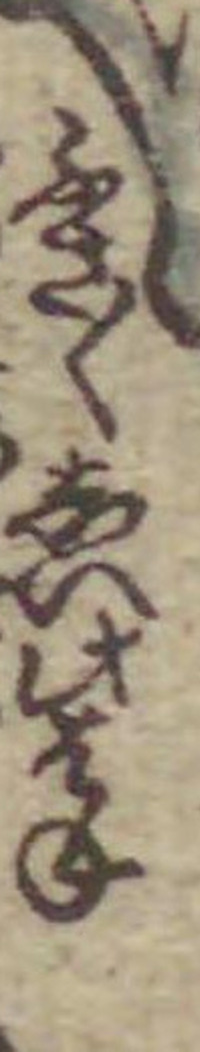ふさ〳〵しい此はね
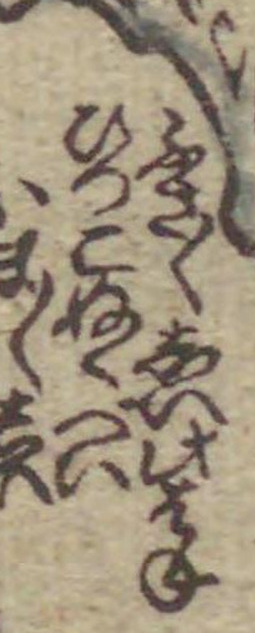ひつこぬくべい
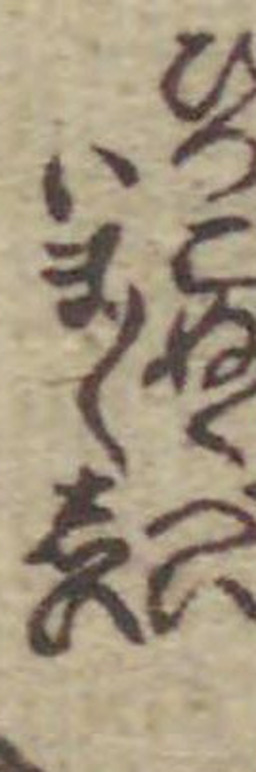いま〳〵しい
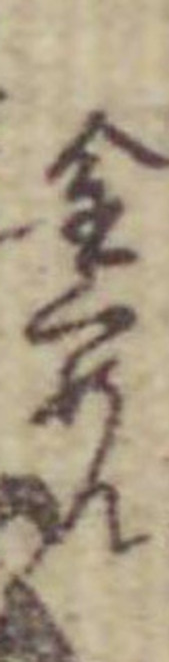金くめん
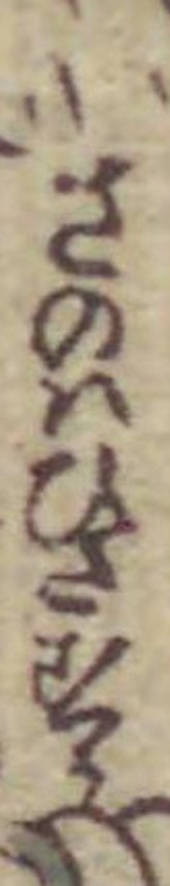さのはひたすら
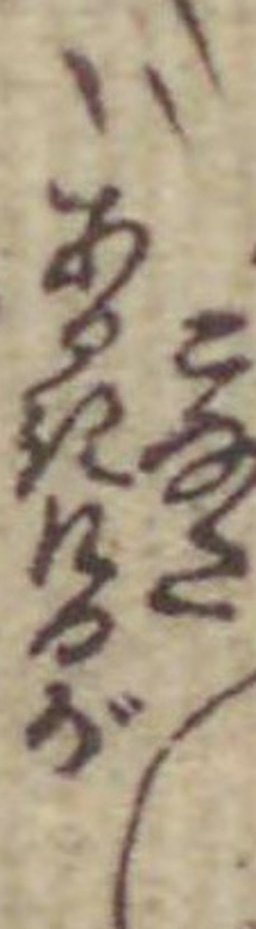あるきけるが
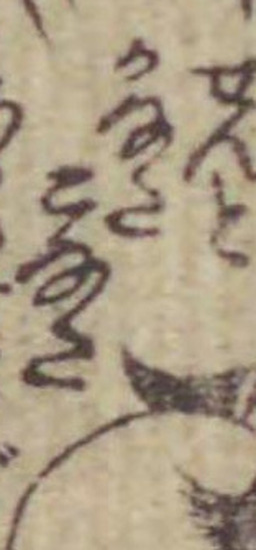こなた
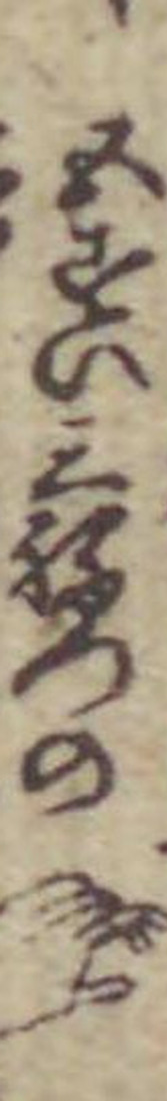五すい三ねつの
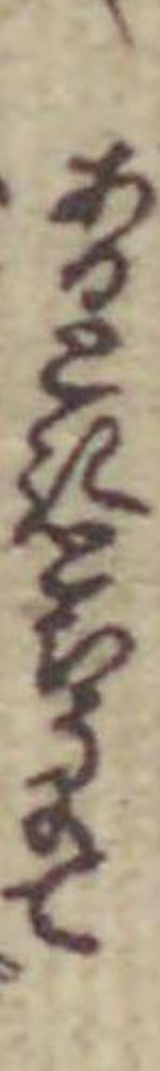あるときとちうにて
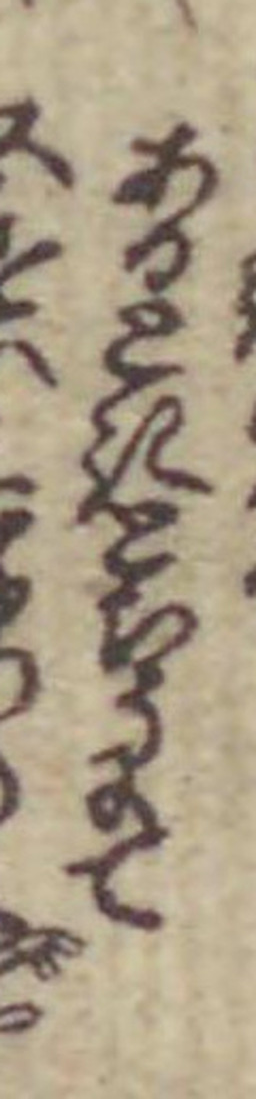あるときとちうにて
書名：娜二代鉢木 5巻
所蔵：国立国会図書館 National Diet Library, JAPAN
